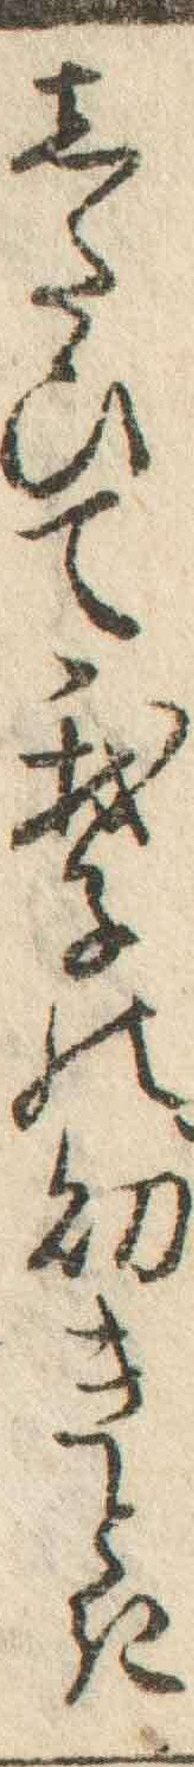したひて我子の幼きとき
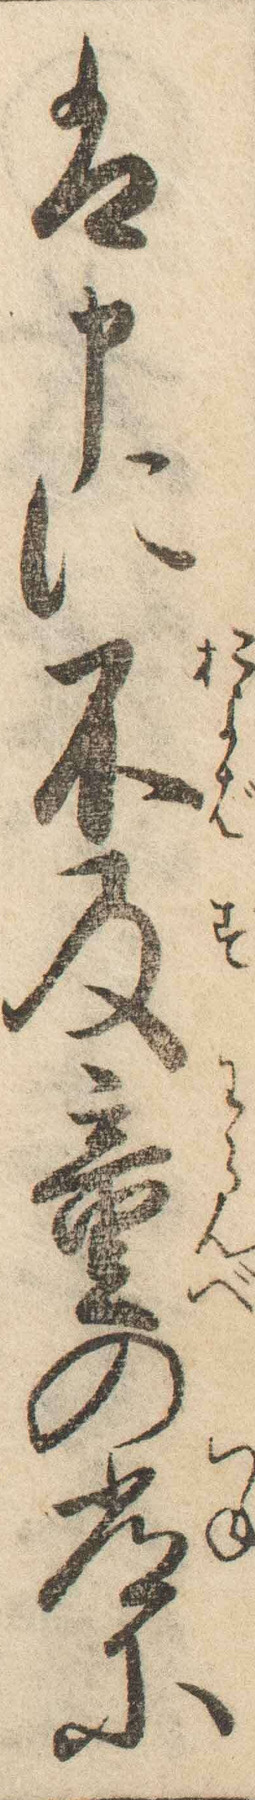は申に不及童の常に
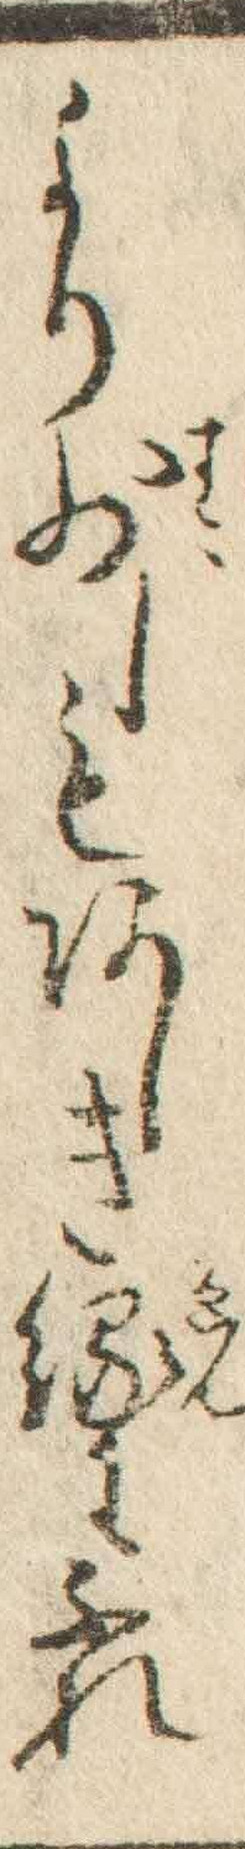より少しもあしき縁にふれ
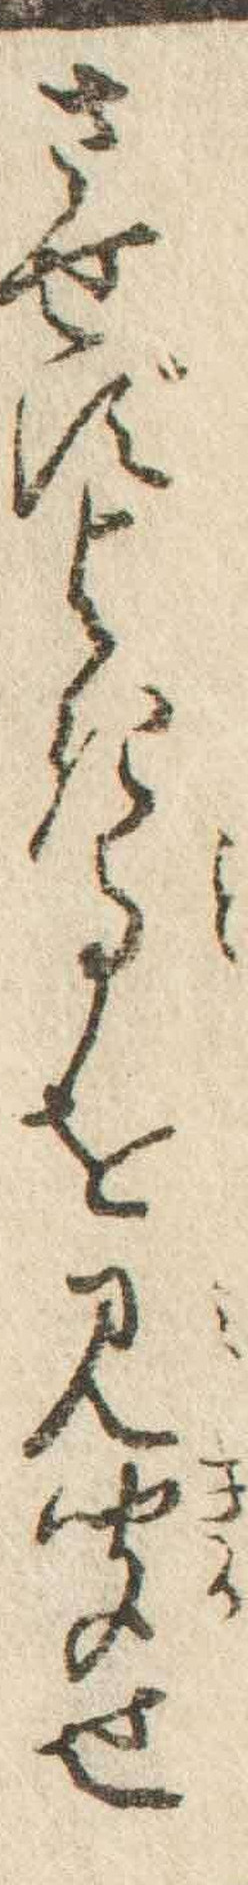させずよき事を見聞せ
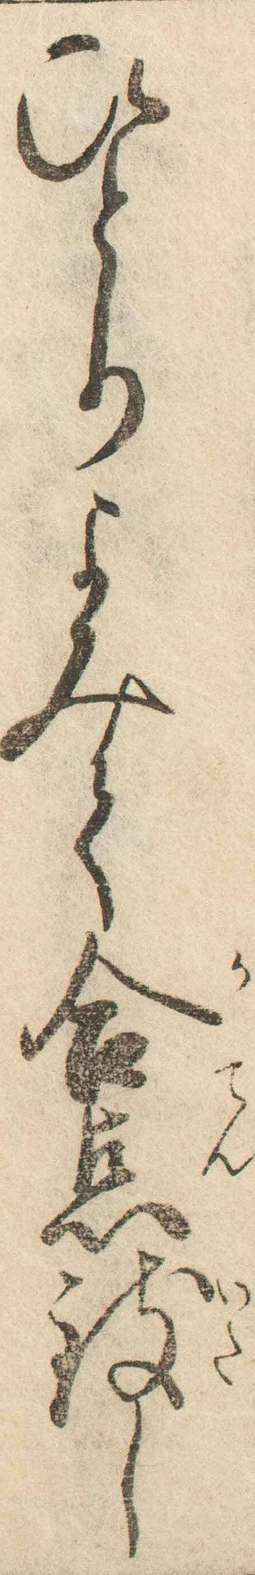ひとりよみて合点致し
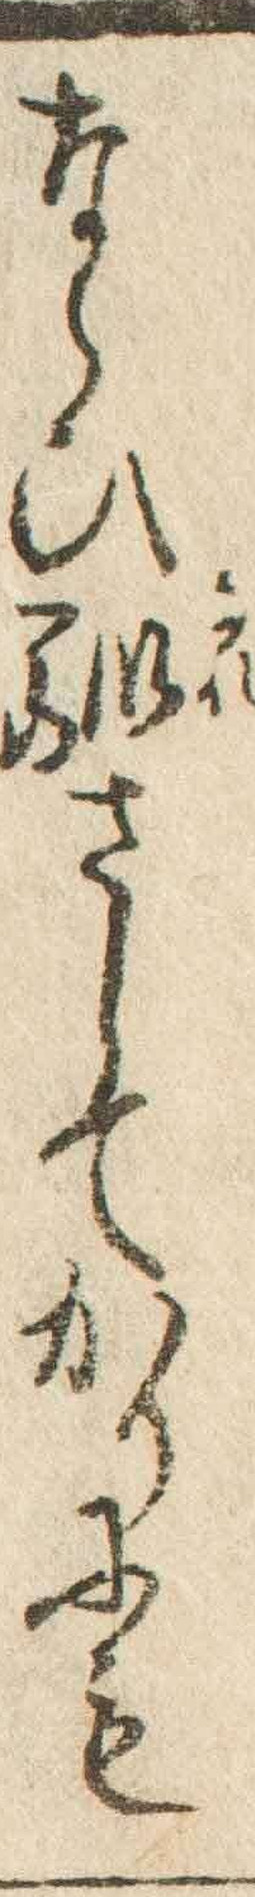ならひ馴さしてかりにも
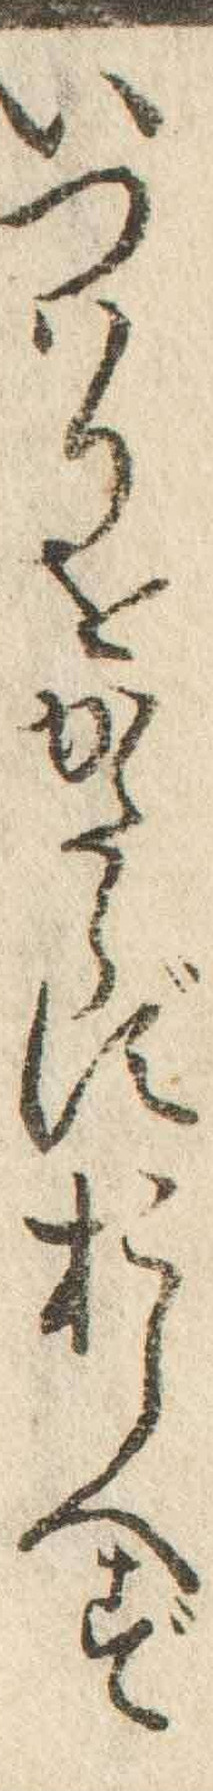いつはりをかたらずおしへず
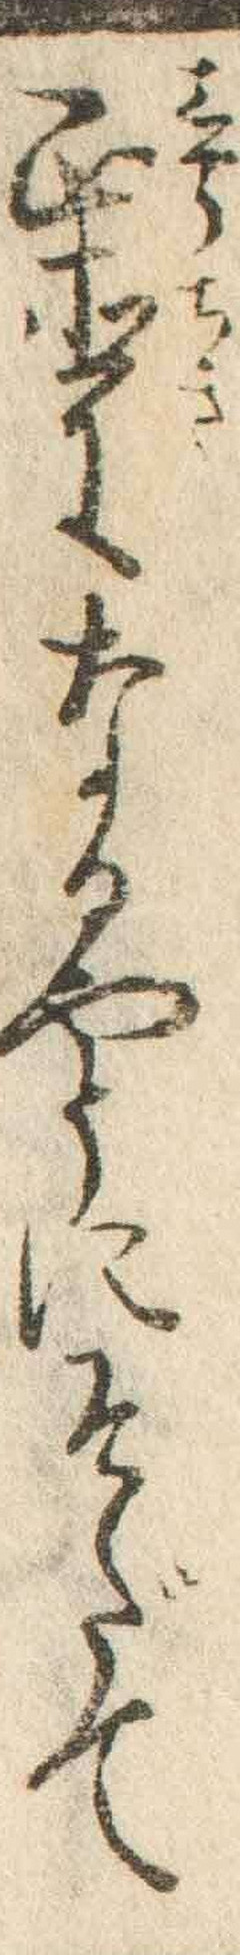正直になるやうにそだて
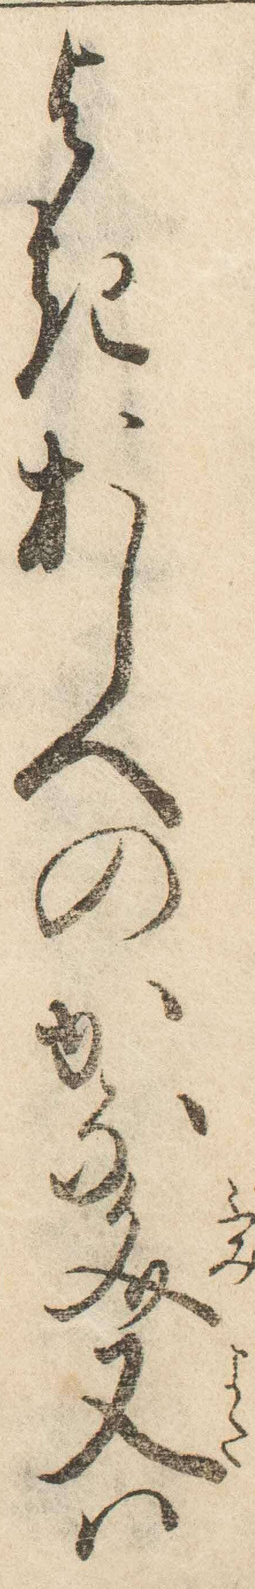よきおしへのかな文又は
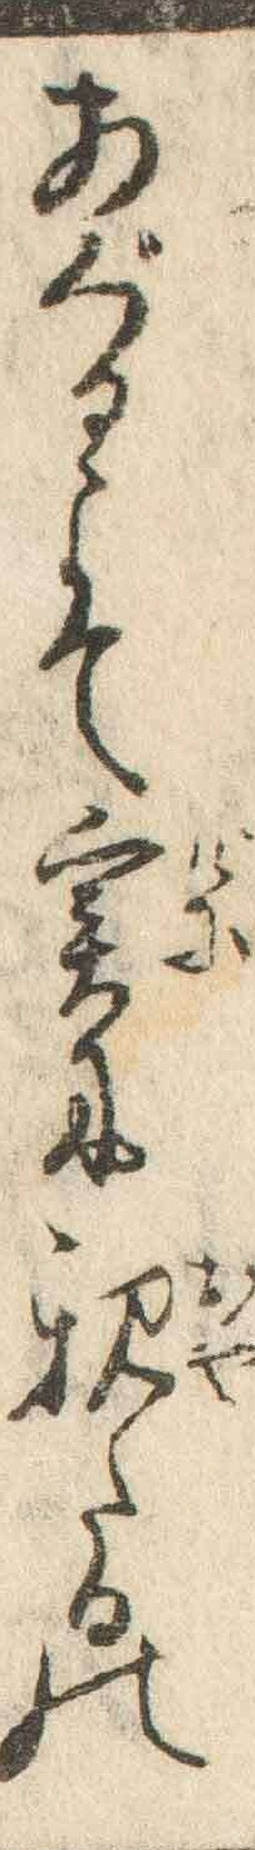あぐるにて実に親たるの
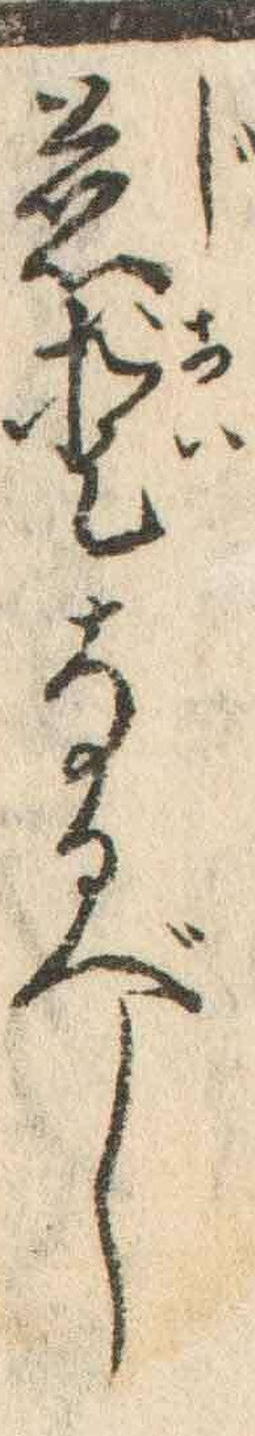慈愛なるべし
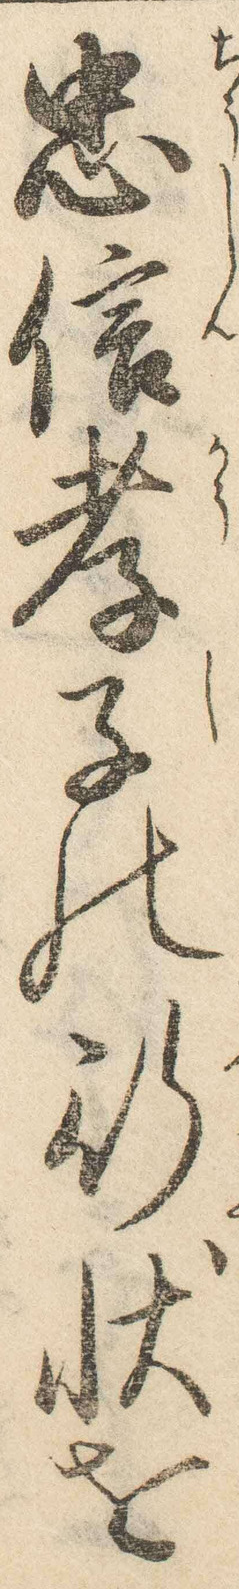忠信孝子の行状を
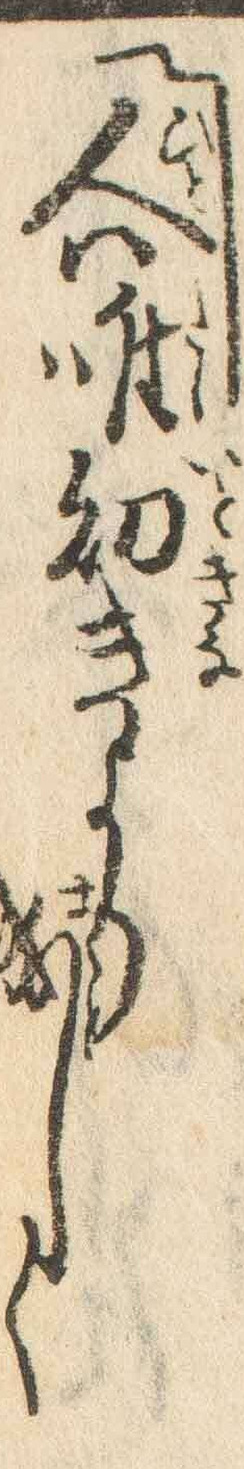〽人は唯幼きより誠しく
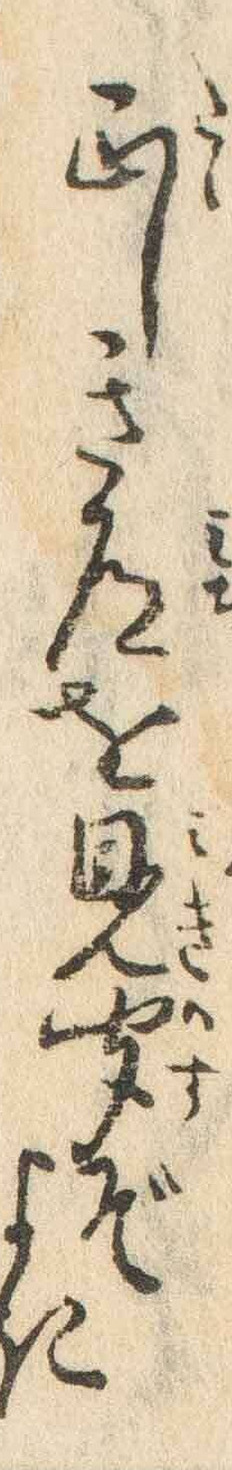正しき道を見聞ぞよき
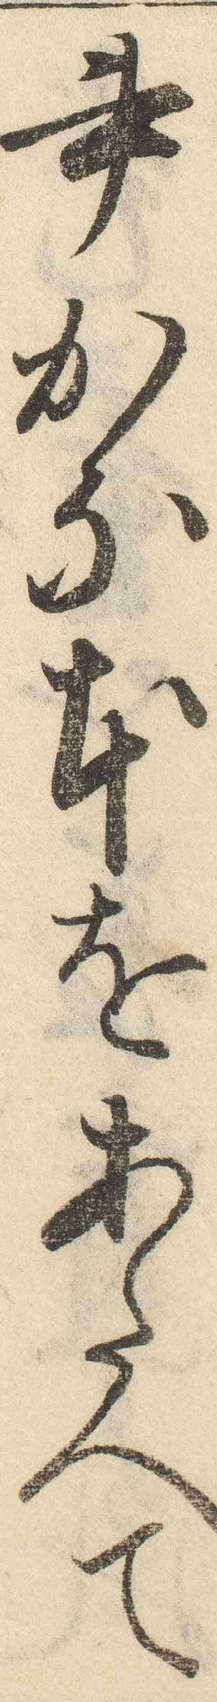書かな本をあたへて
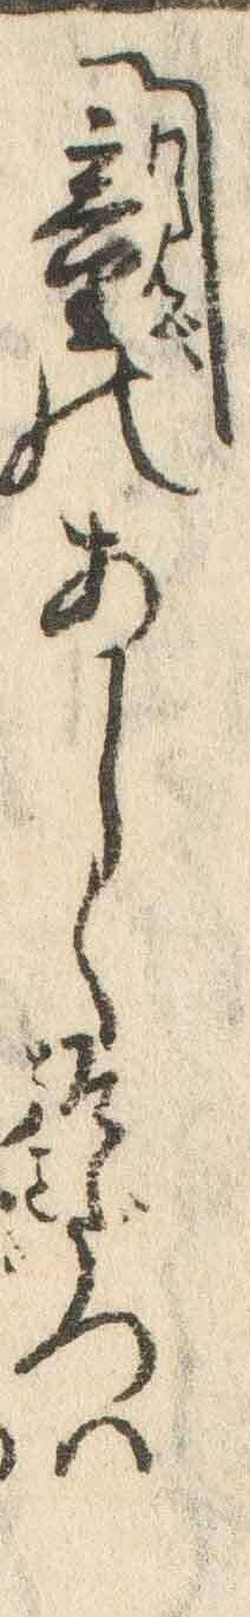〽童のあしくそだつは
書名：撫育草
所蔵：東京学芸大学附属図書館 国文学研究資料館
